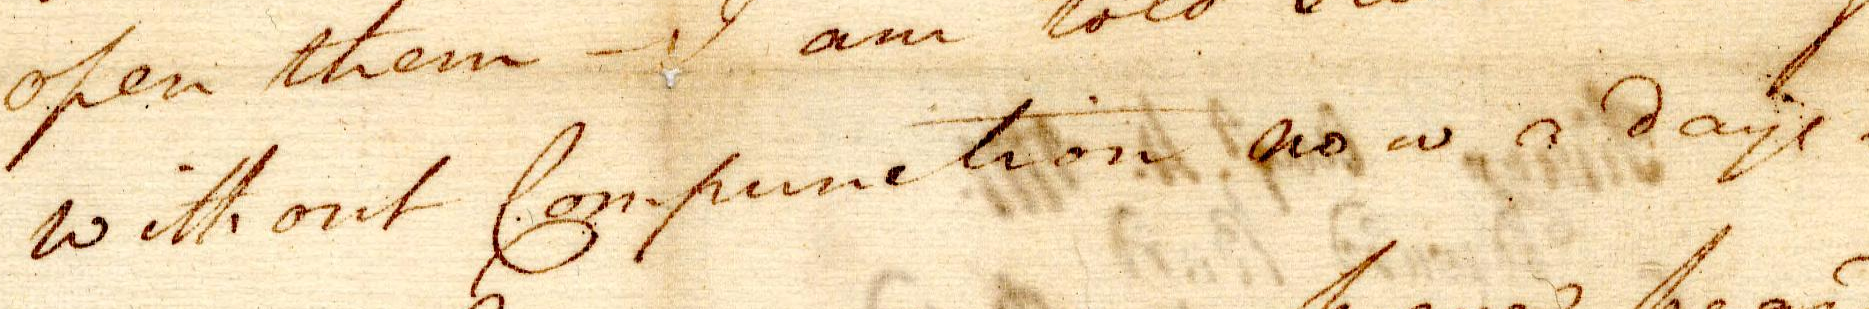without Conpunction nowadays-
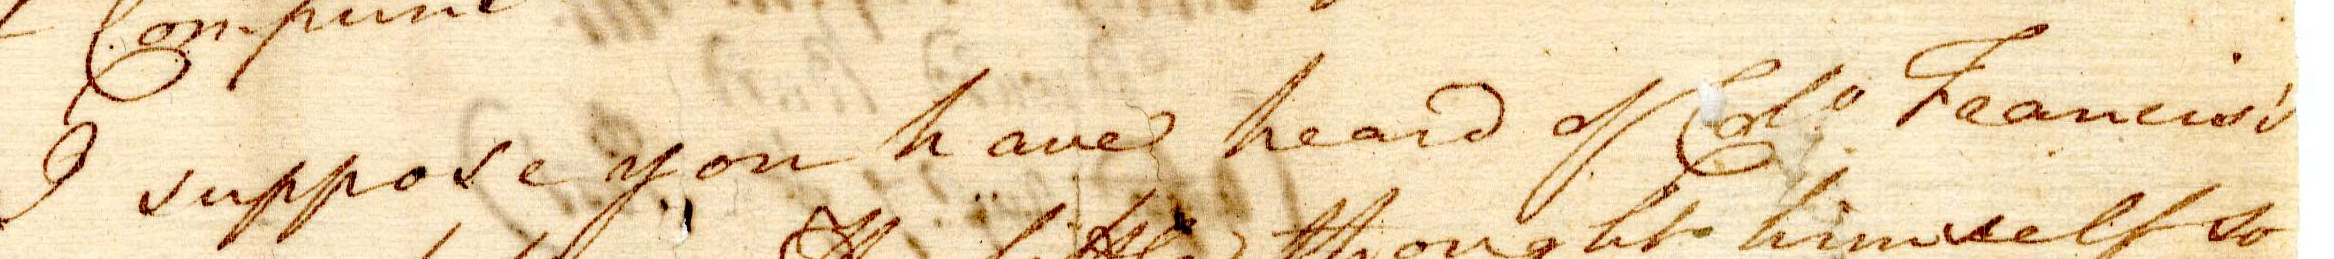I suppose you have heard of Col^o Francis's
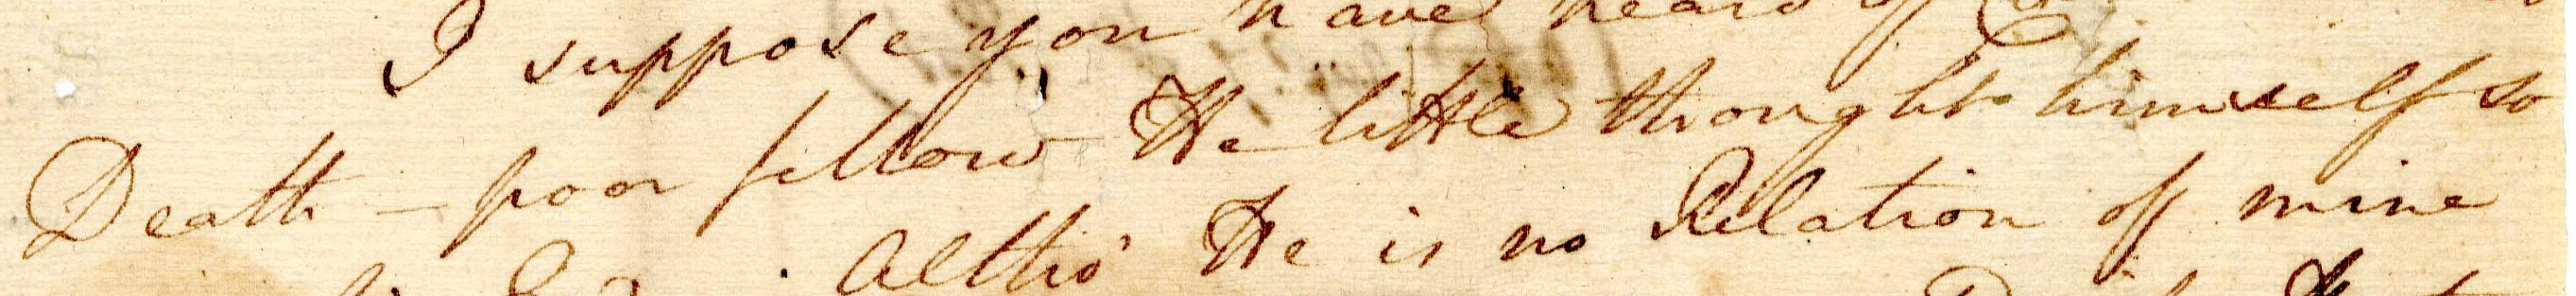Death- poor fellow He little thought himself so
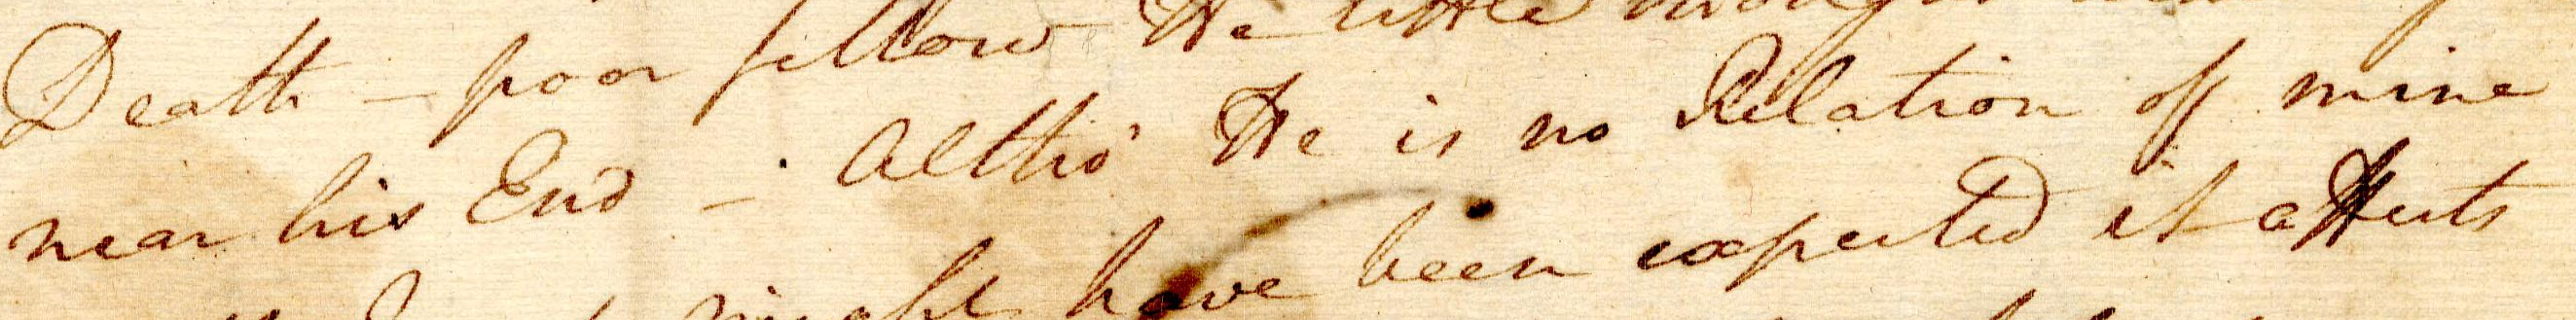near his End- Altho' He is no Relation of mine
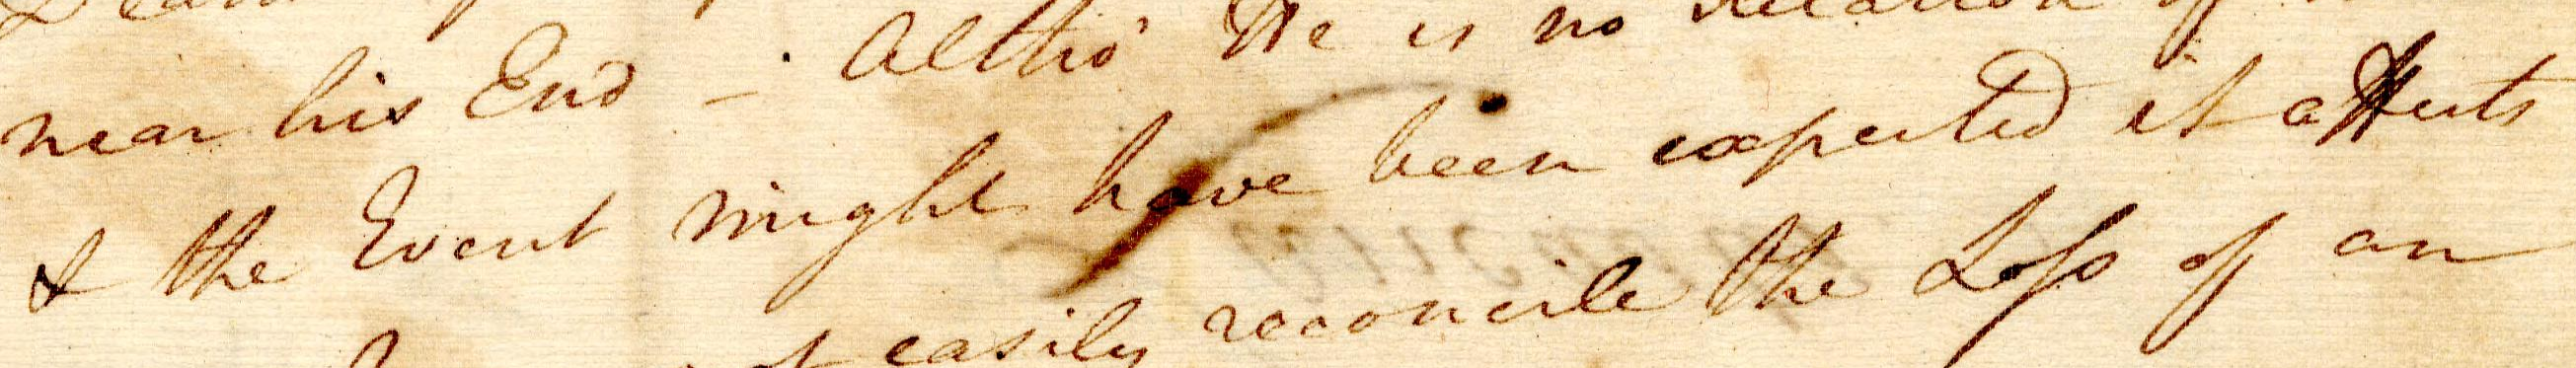& the Event might have been expected it affects
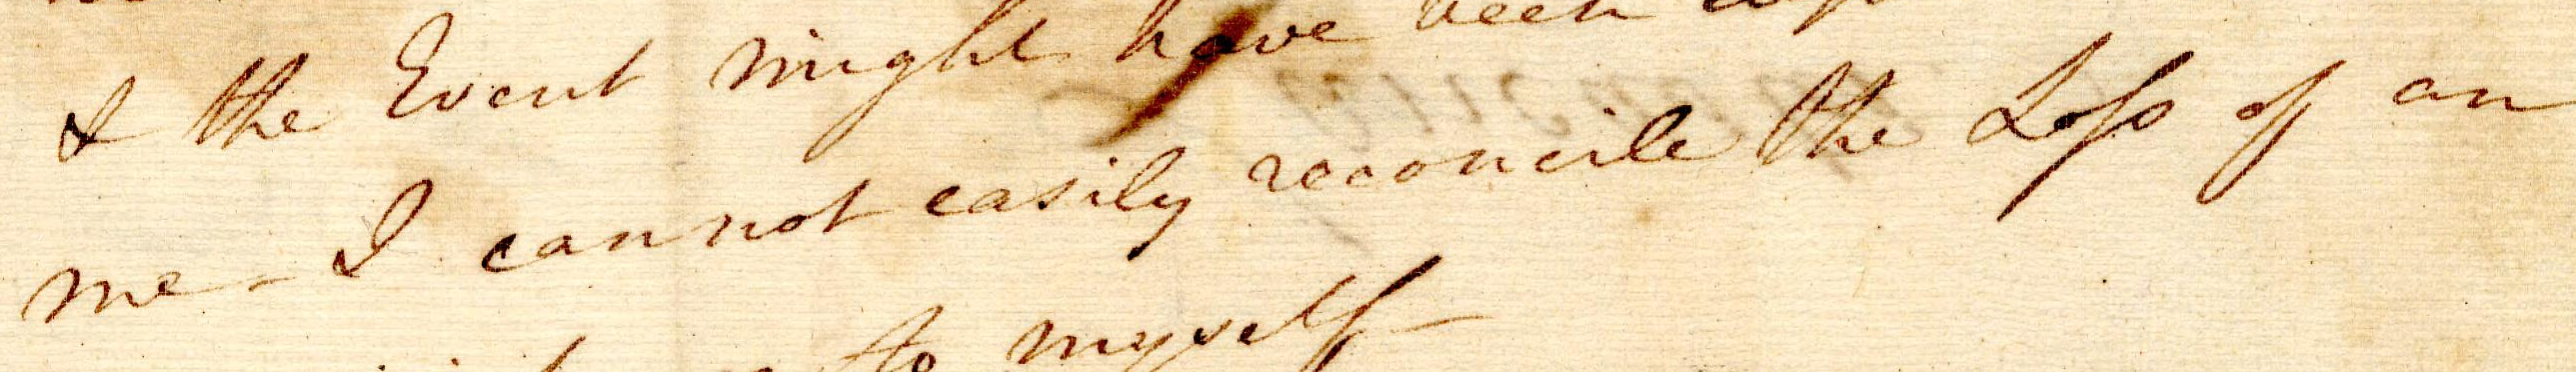me- I cannot easily reconcile the Loss of an
